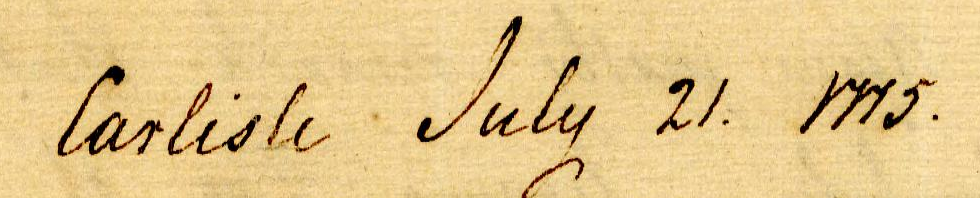Carlisle July 21. 1775.
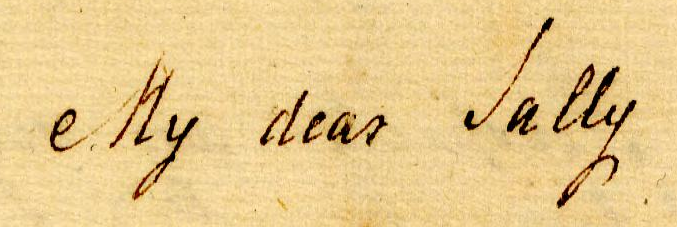My dear Sally
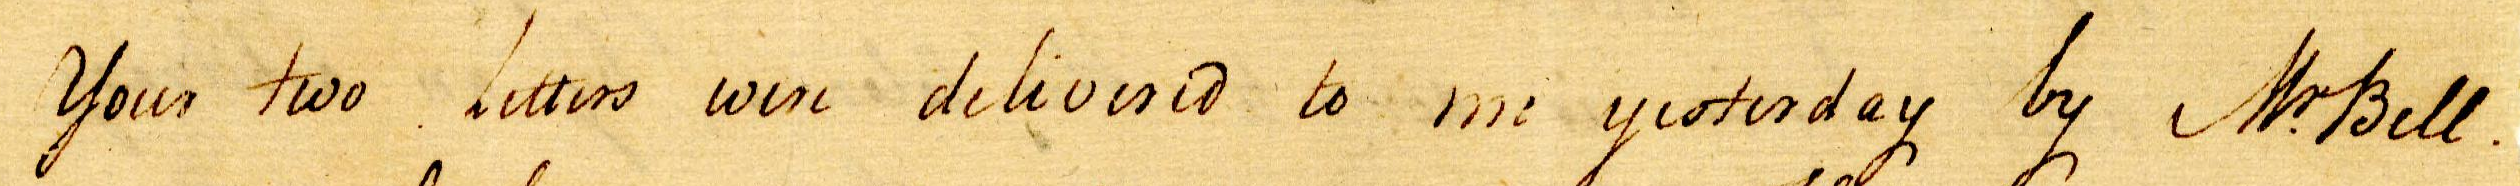Your two Letters were delivered to me yesterday by M^r. Bell
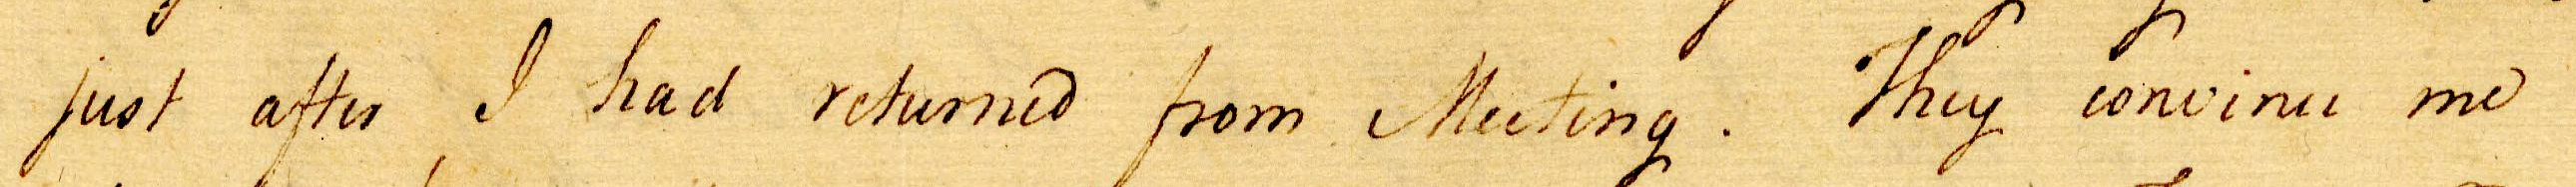just after I had returned from Meeting. They convince me
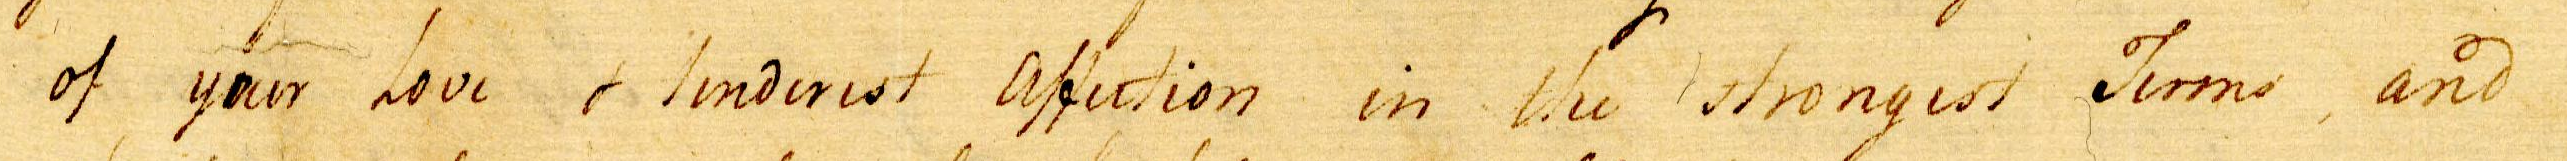of your Love & Tenderest Affection in the strongest Terms and
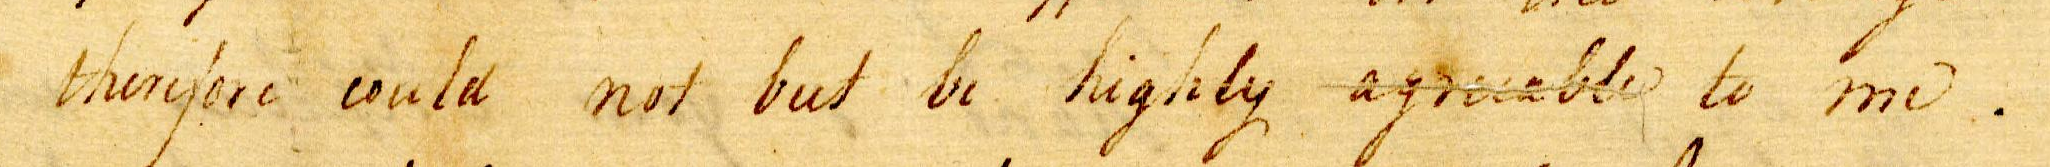therefore could not but be highly agreeable to me.
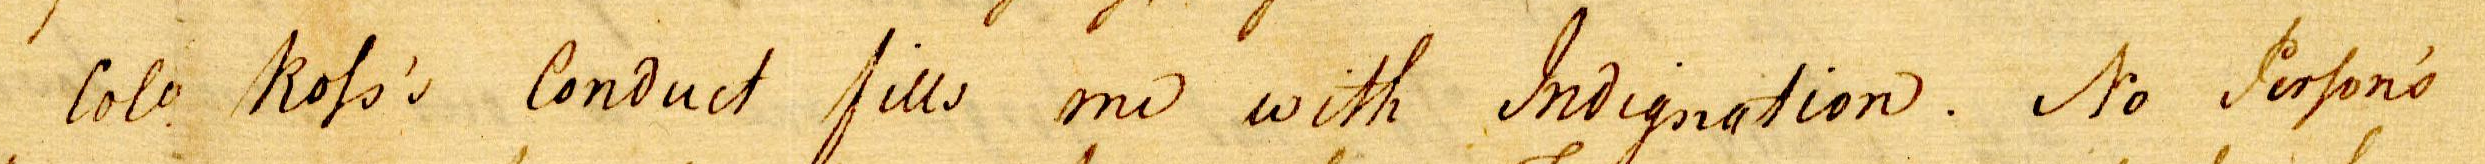Col^o Ross's Conduct fills me with Indignation. No Person's
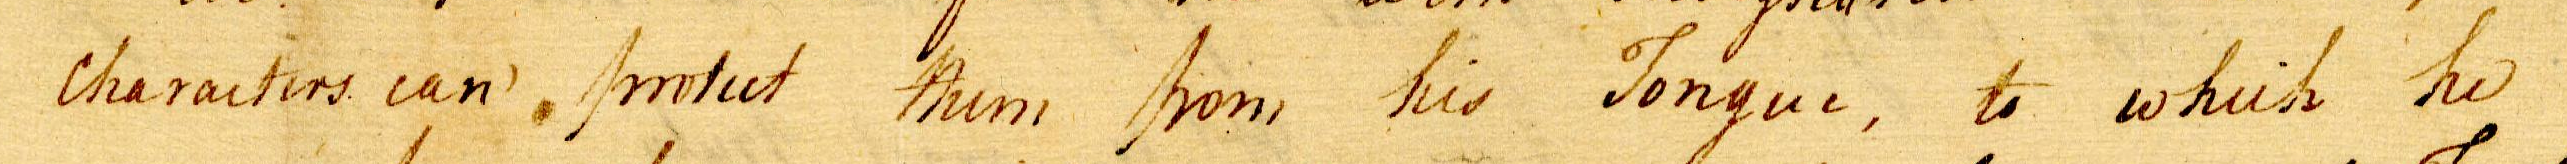characters can protect them from his Tongue, to which he
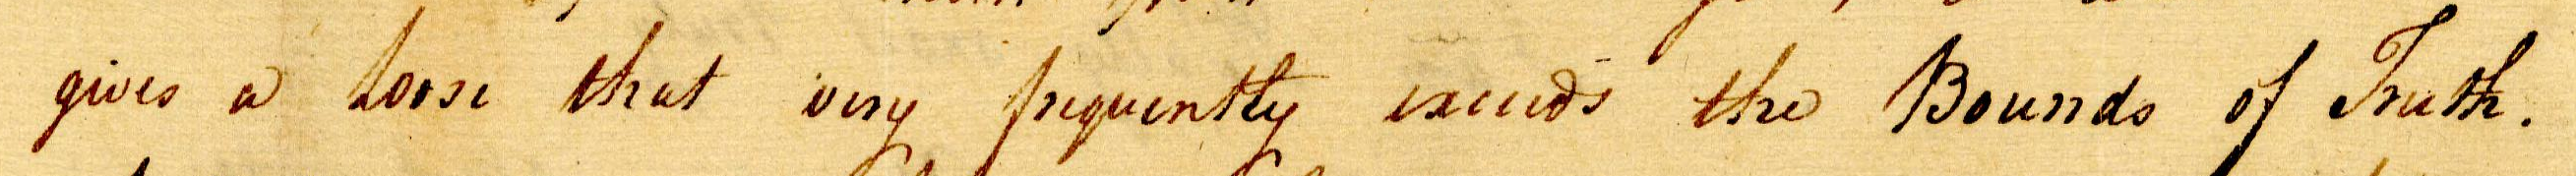gives a Loose that very frequently exceeds the Bounds of Truth.
